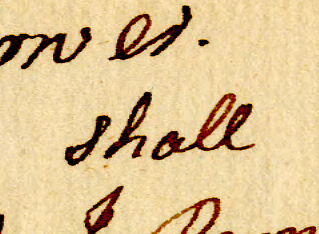shall
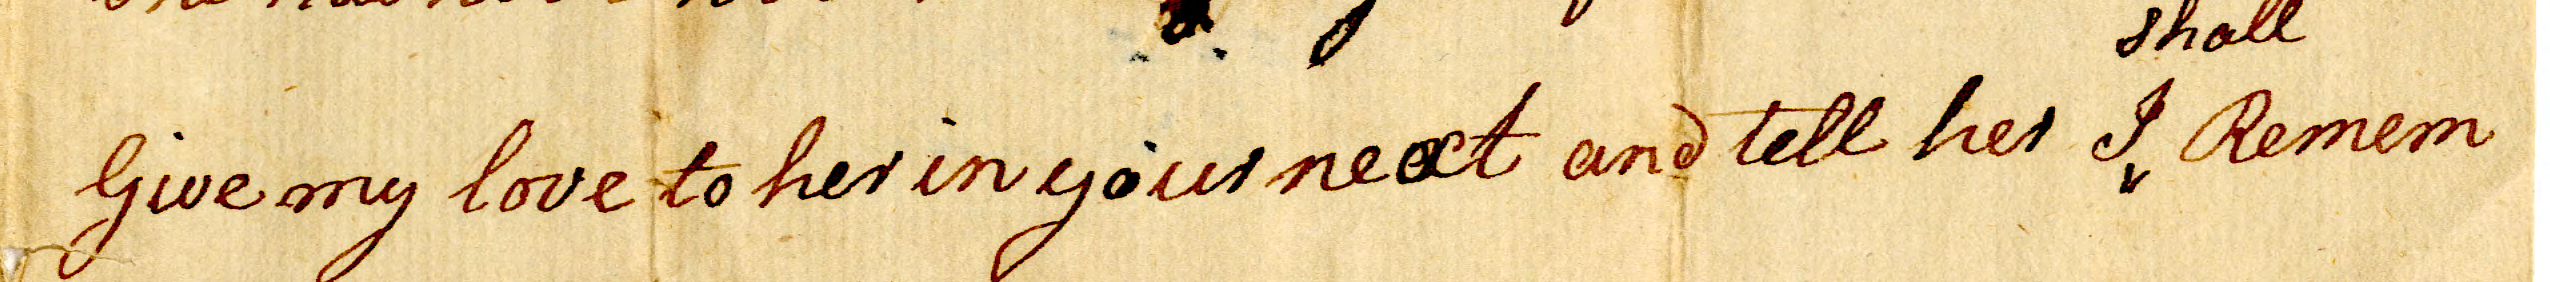Give my love to her in your next and tell her I ^ Remem
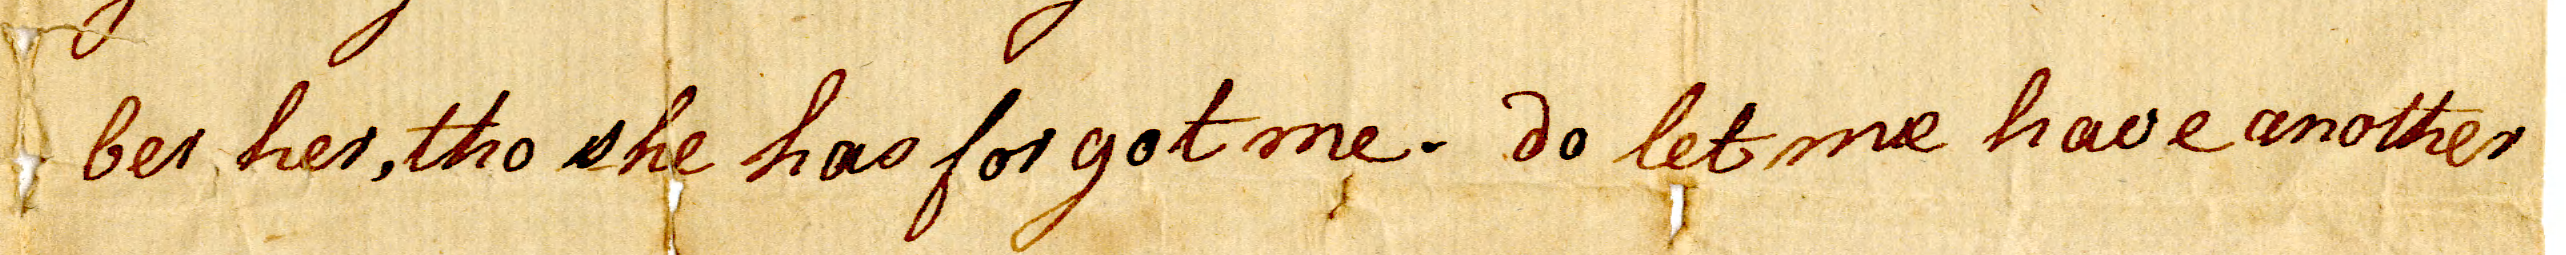ber her, tho she has forgot me. do let me have another
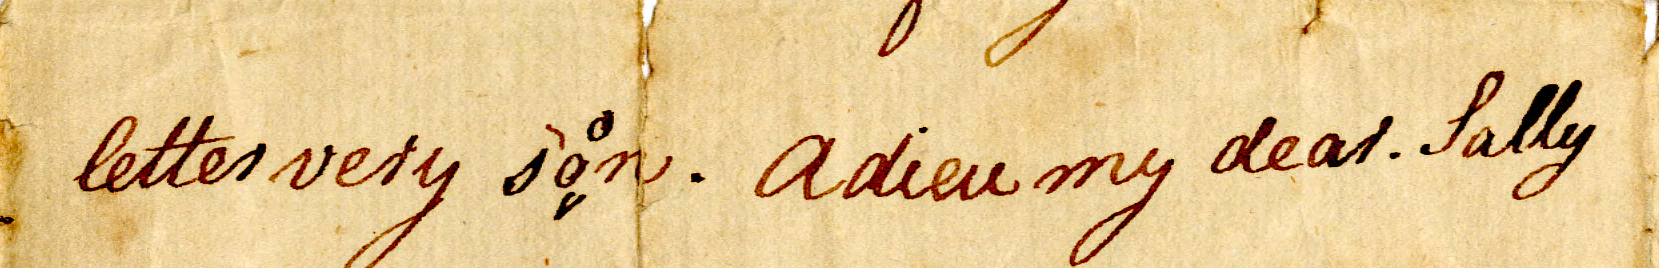letter very so^on. Adieu my dear. Sally
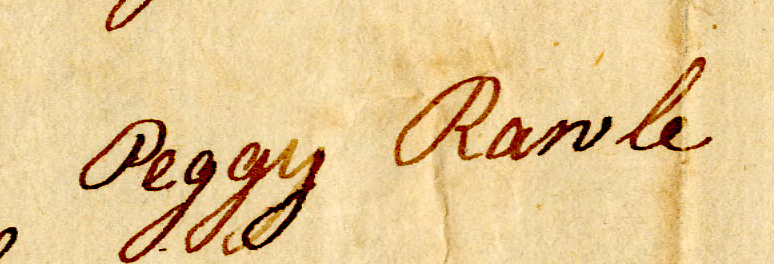Peggy Rawle
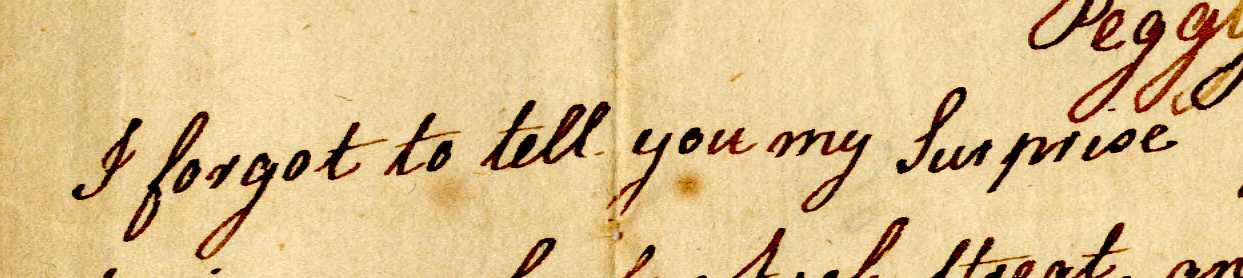I forgot to tell you my surprise
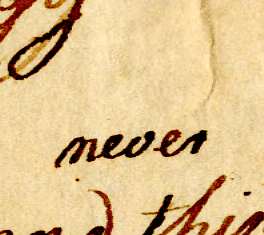never
